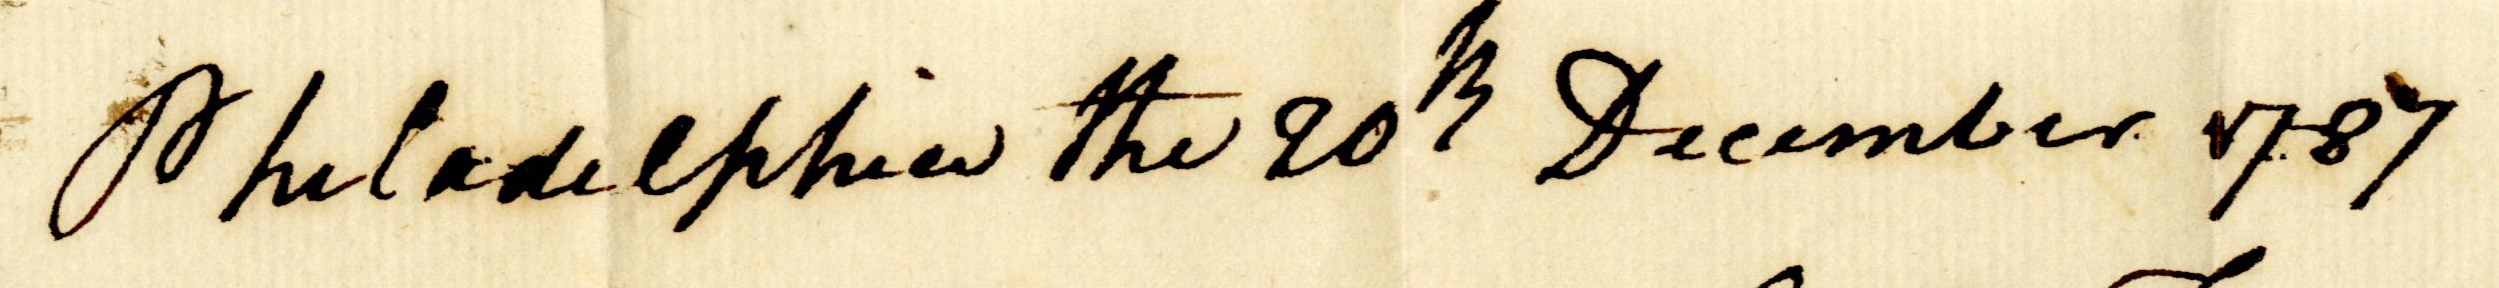Philadelphia the 20^t. December 1787
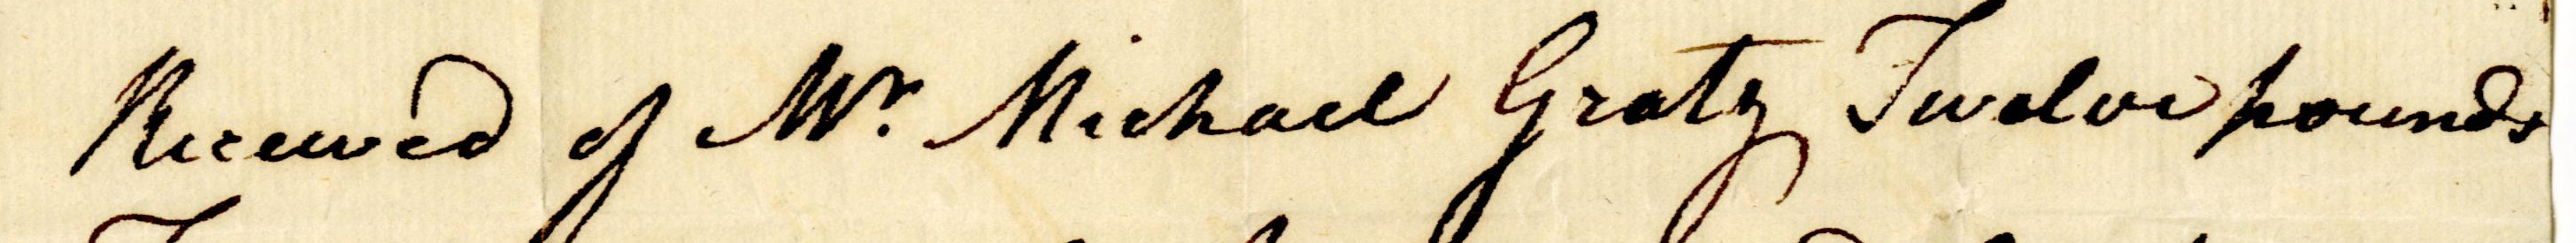Received of M^r Michael Gratz Twelve pounds
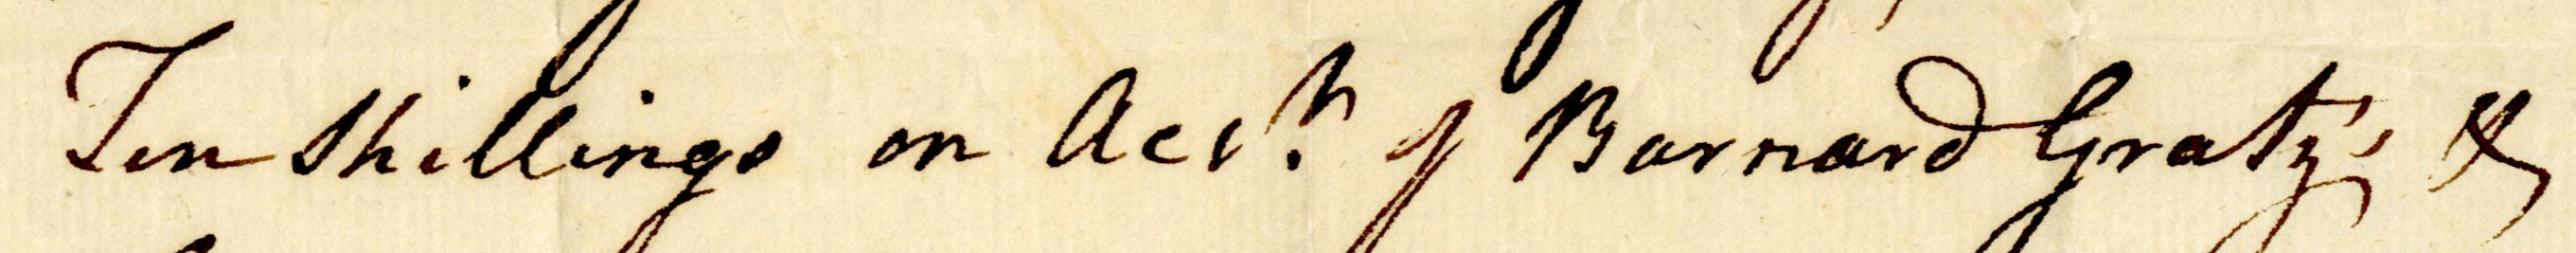Ten shillings on Acc^t. of Barnard Gratz &
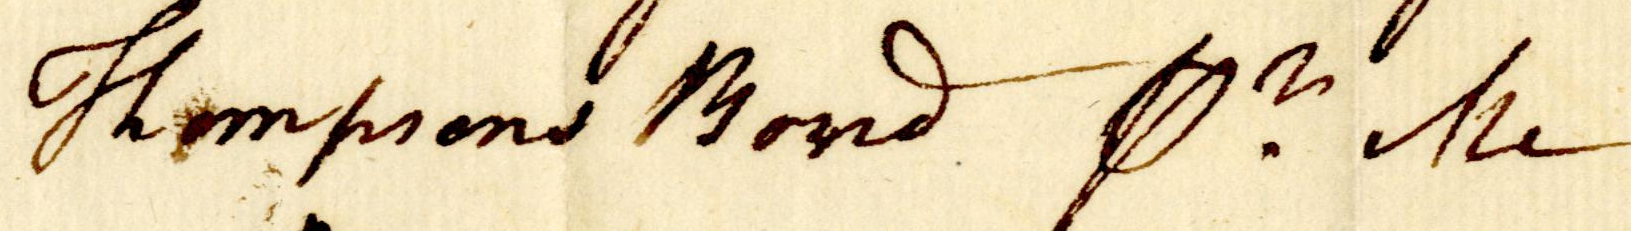Thompsons Bond. P^r he
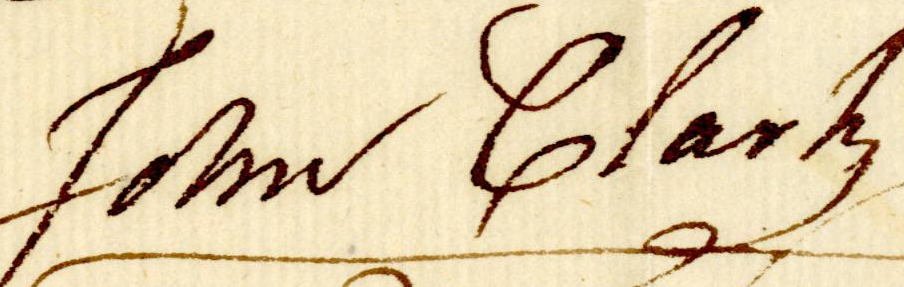John Clark
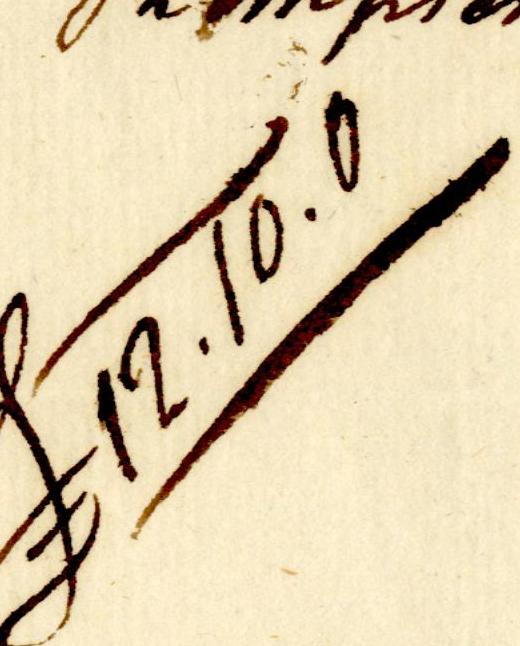£12.10.0
